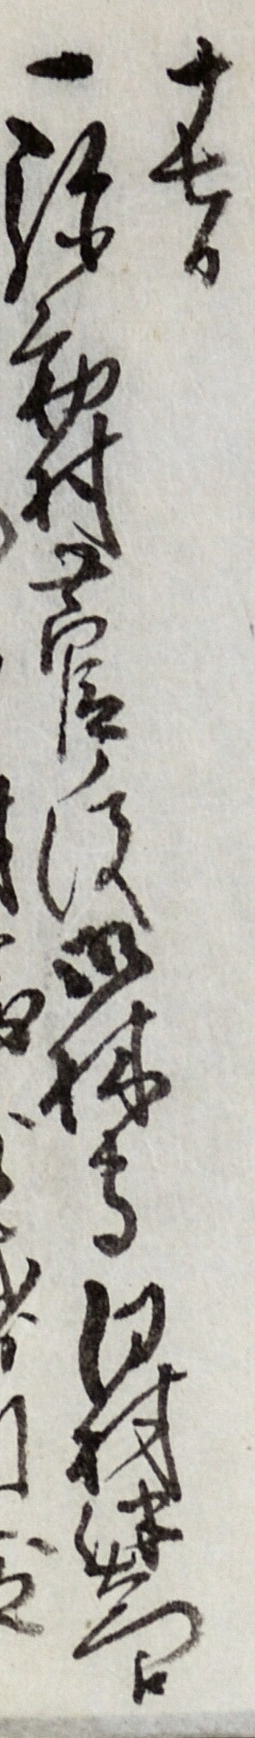一弥勒村菅ノ沢御林守日村伴右衛門江
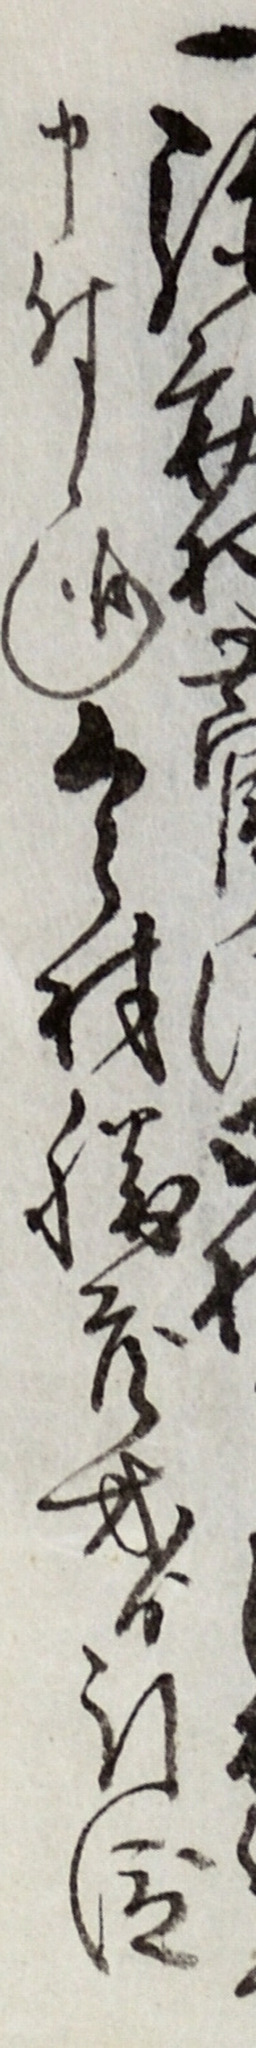申付候趣今村勝蔵方ゟ引渡
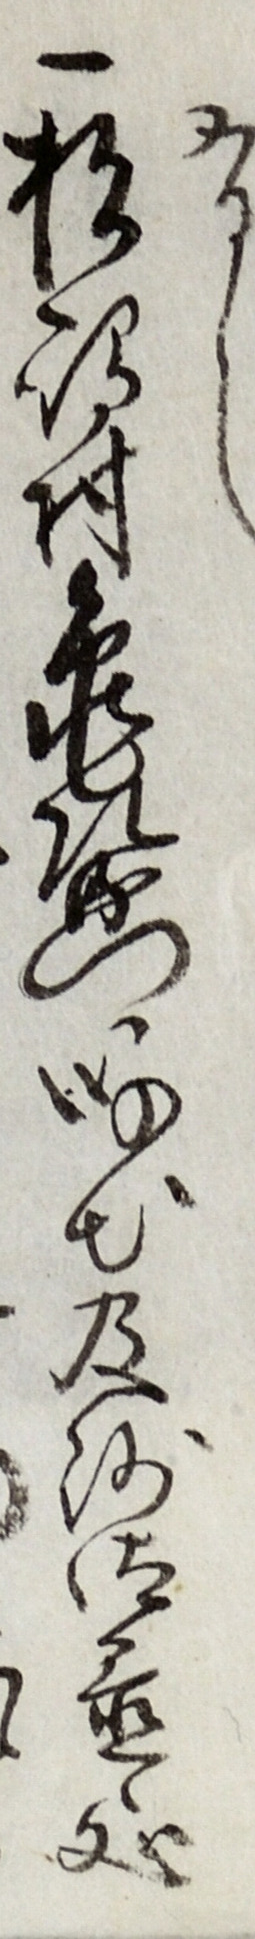一杉嶋村亀左衛門呼出及沙汰置候処
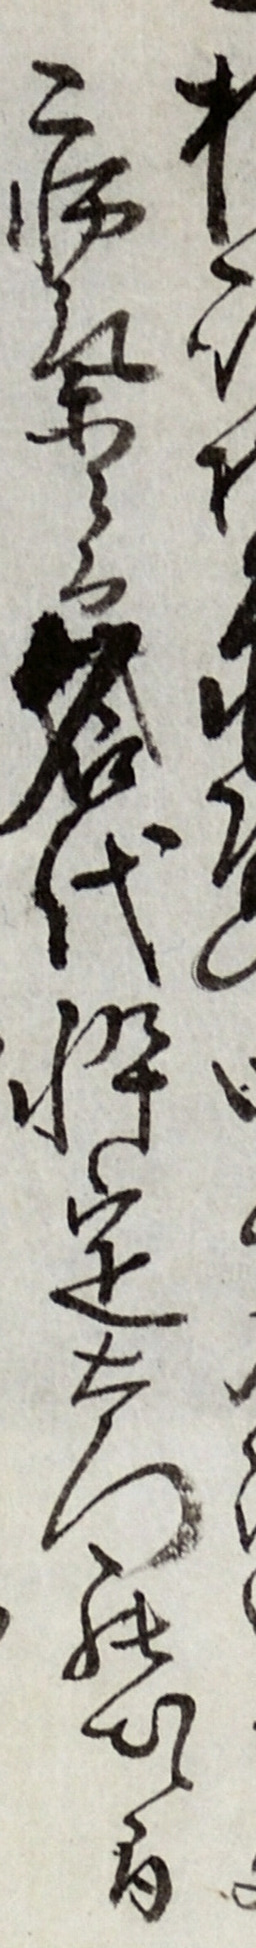病気ニ而名代忰定右衛門罷出候間
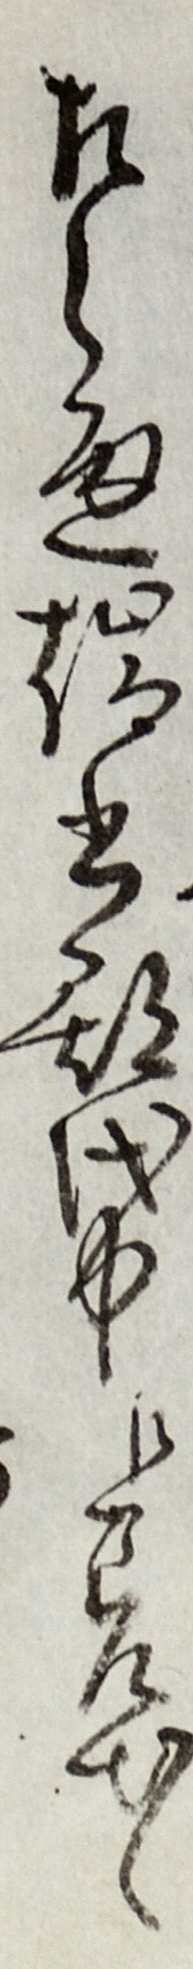左之通端書郡代中江差出候
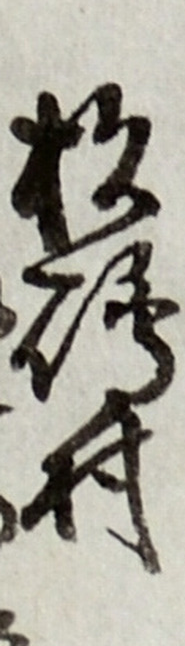杉嶋村
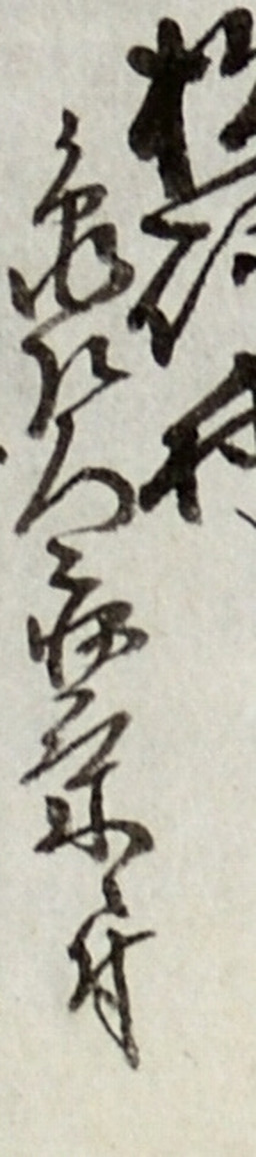亀左衛門病気ニ付
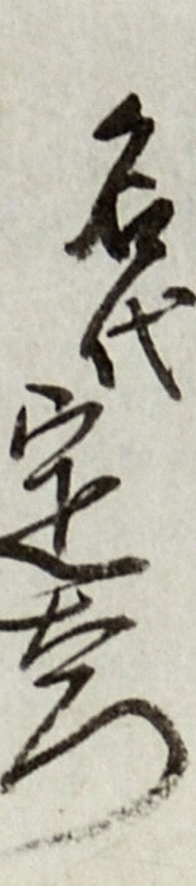名代定右衛門
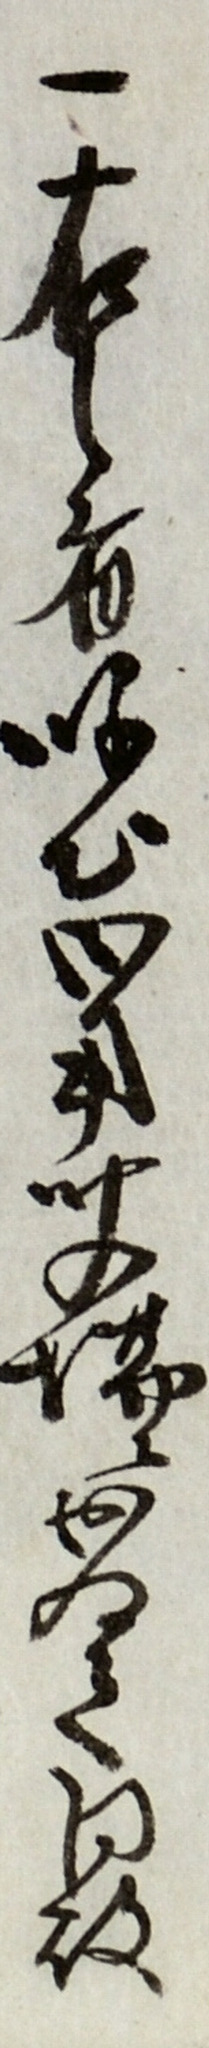一右之者呼出御用聞場ニおゐて同役
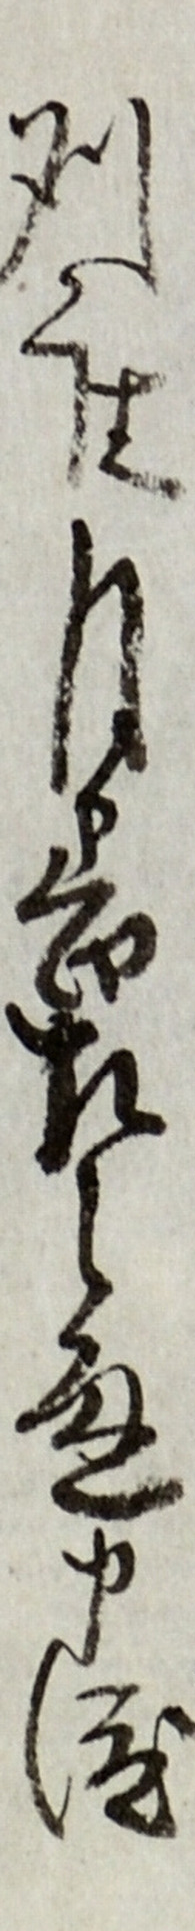列座月番左之通申渡
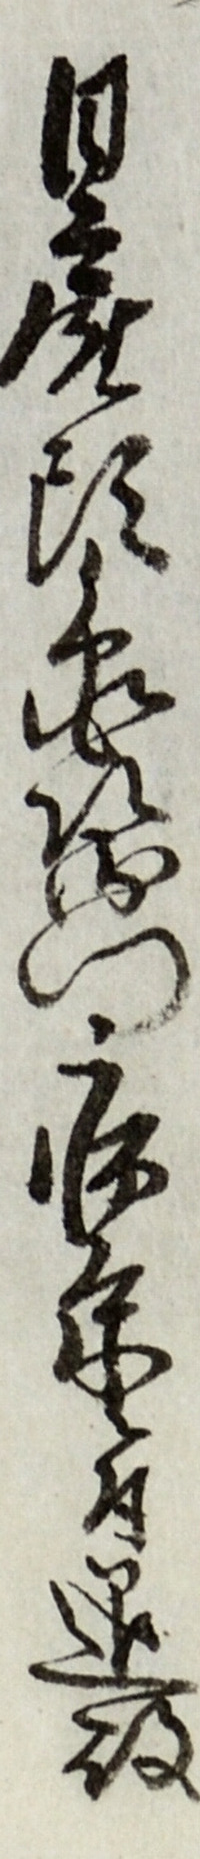日雇頭亀左衛門病気ニ付退役
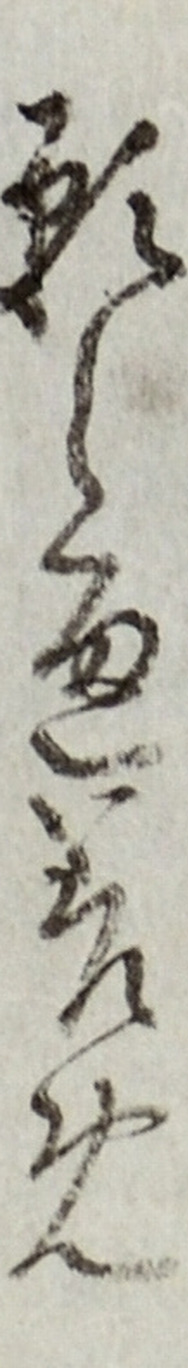願之通差免
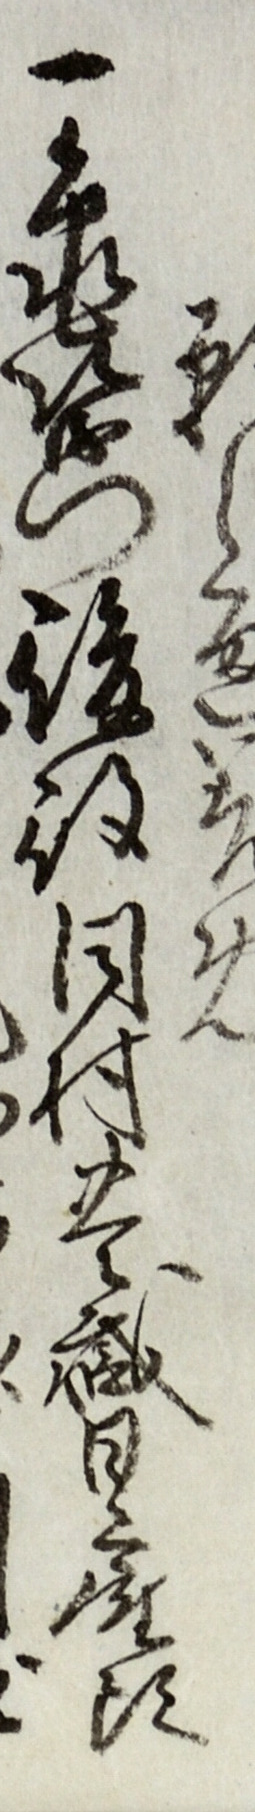一亀左衛門後役同村豊蔵日雇頭
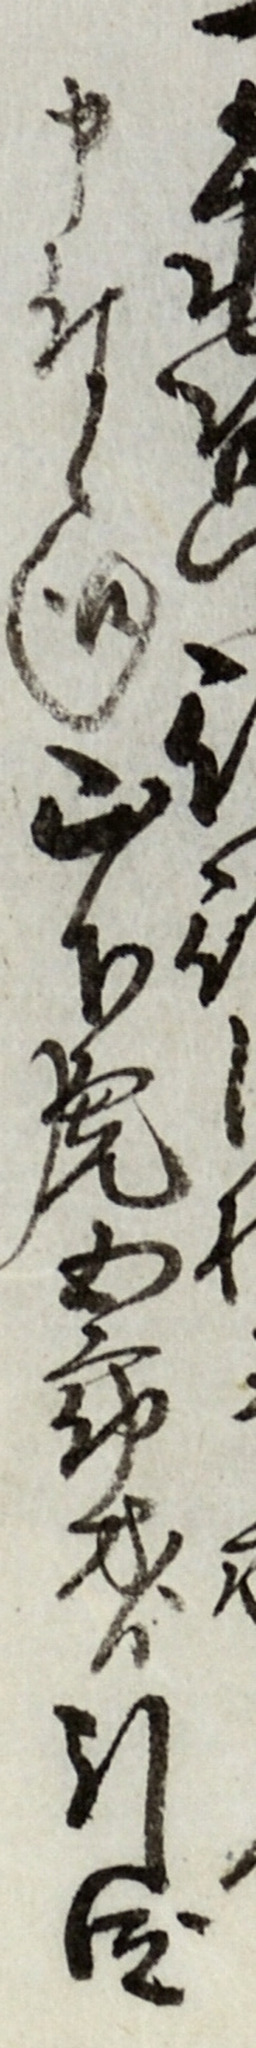申付候趣山下虎五郎方ゟ引渡
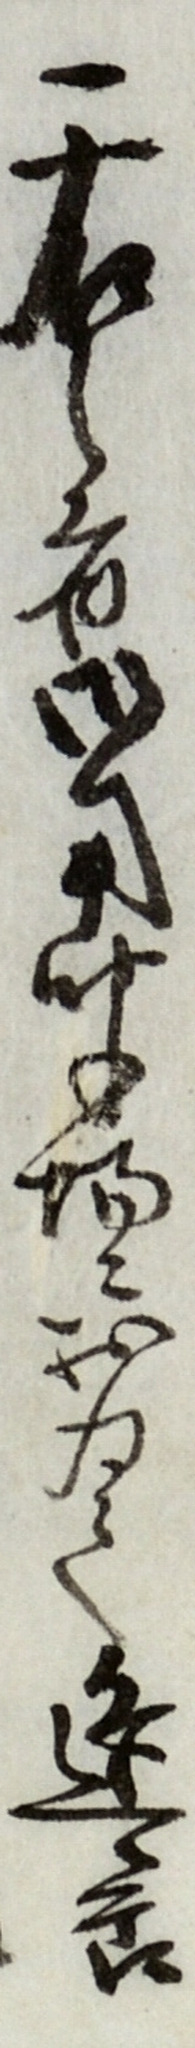一右之者御用聞場ニおゐて逢候節
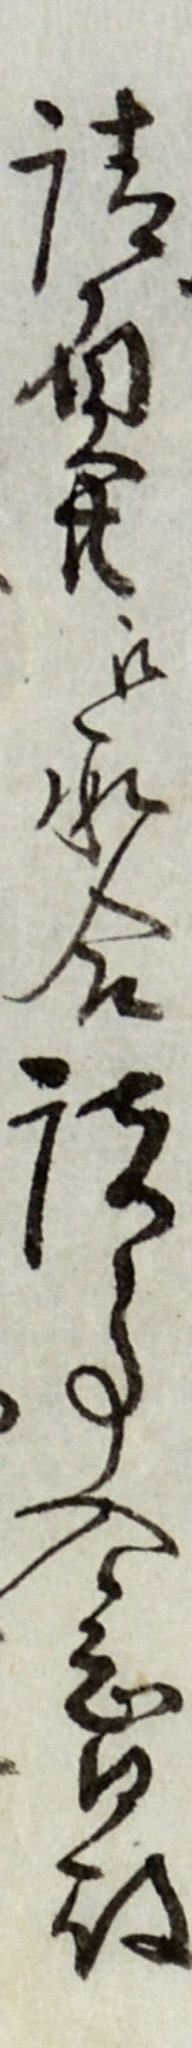請負共江承合諸事入念同役
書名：御山方御薪方諸事御用留
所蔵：伊那市立高遠町図書館・合同会社AMANE
